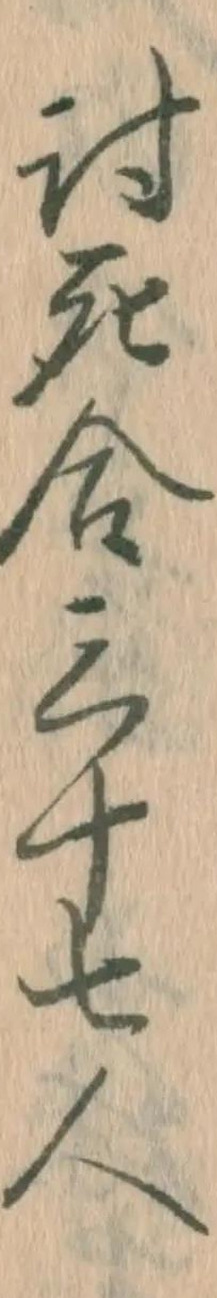討死合三十七人
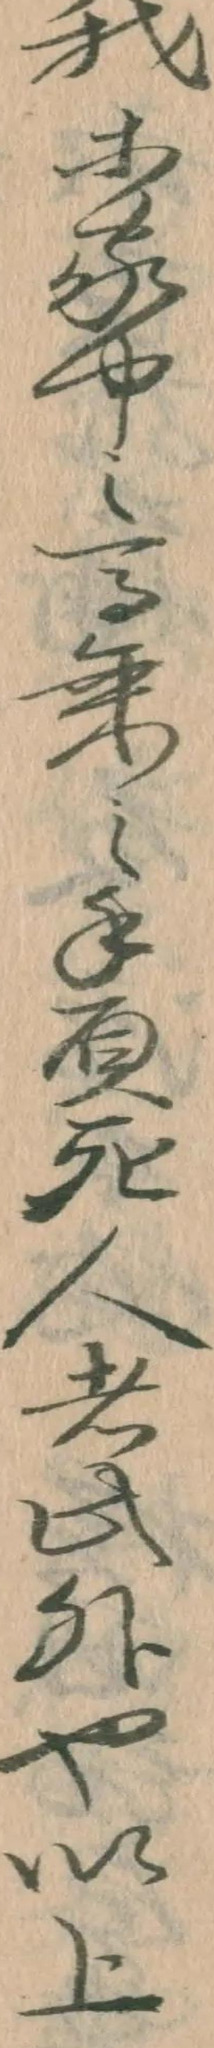我等家中之馬乗之手負死人者此外也以上
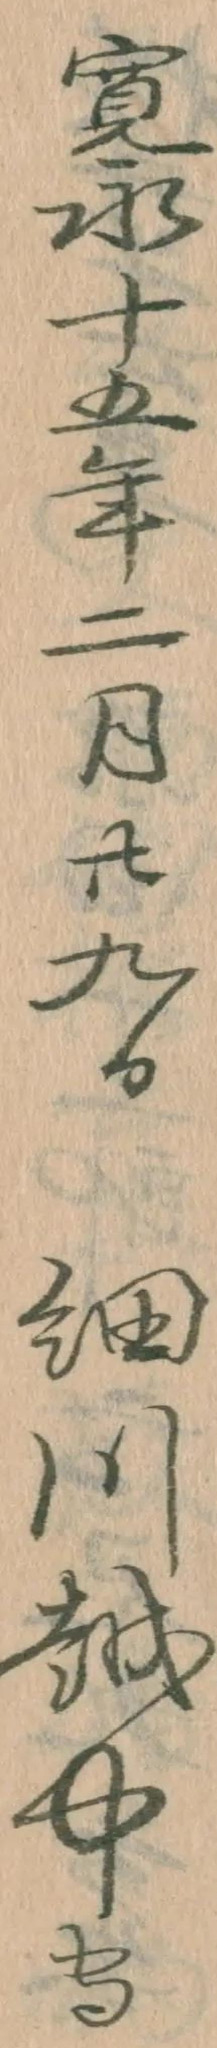寛永十五年二月廿九日細川越中守
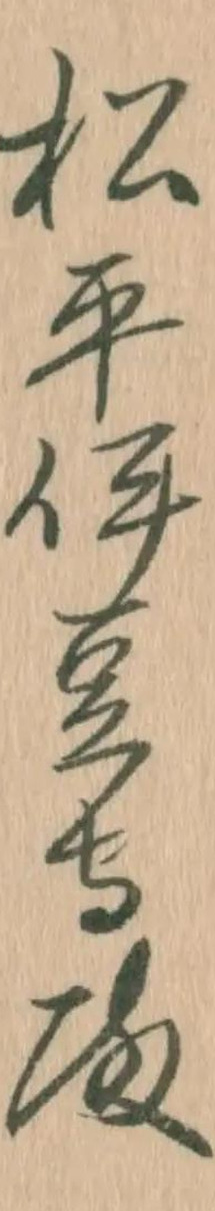松平伊豆守殿
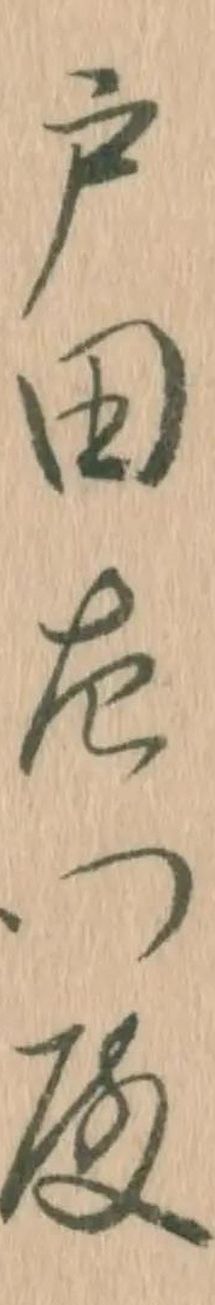戸田左門殿
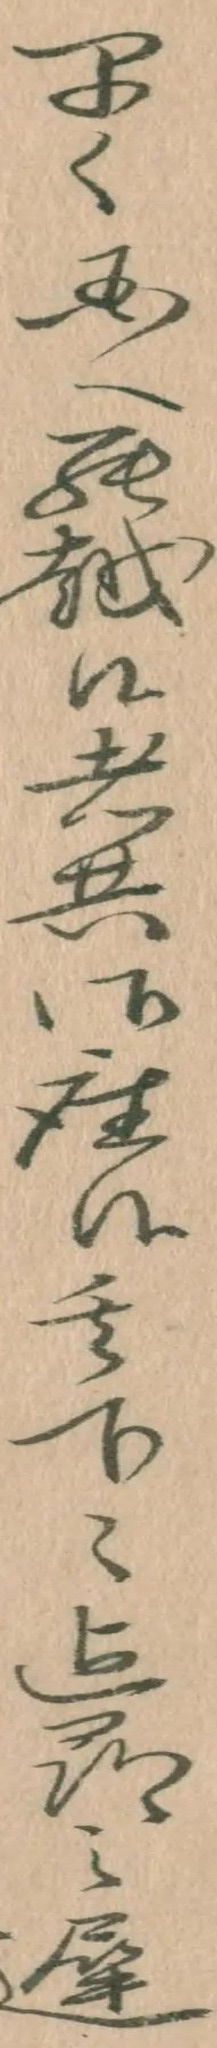早々国へ罷越候者共御座候其下々迄尋之遅
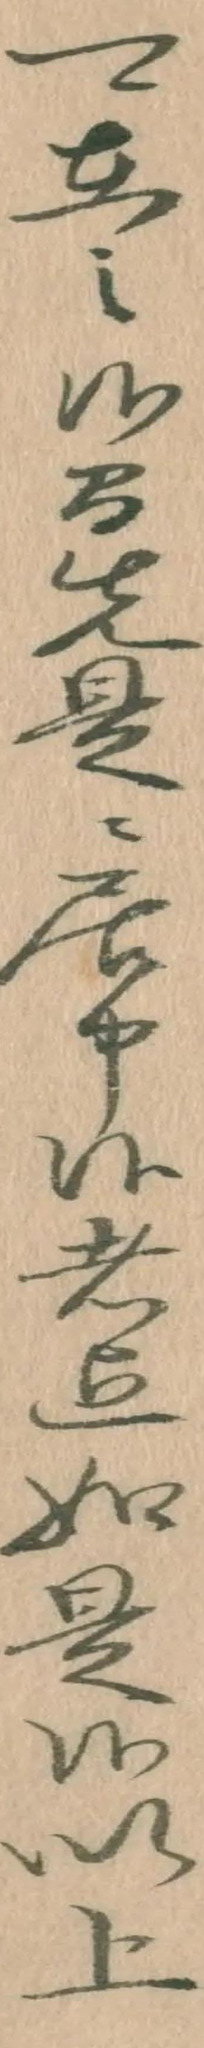可在之候間先是に居申候者迄如是候以上
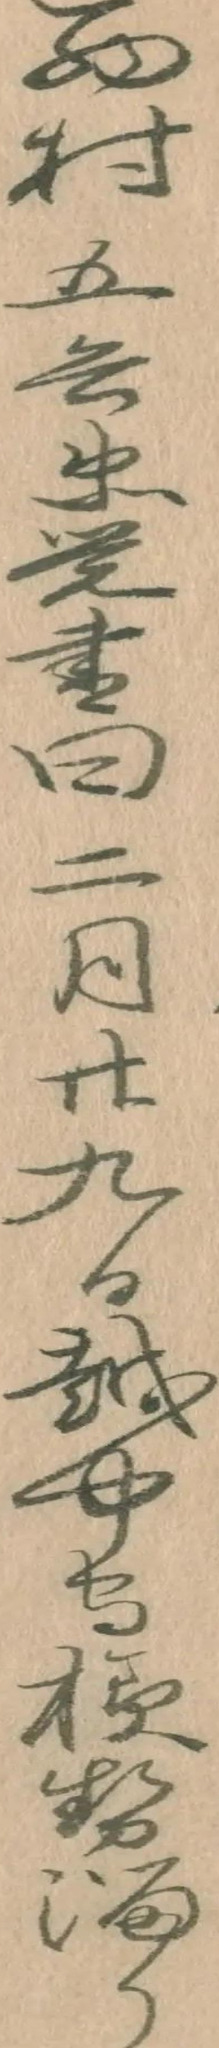西村五兵衛覚書曰二月廿九日越中守様勢溜り
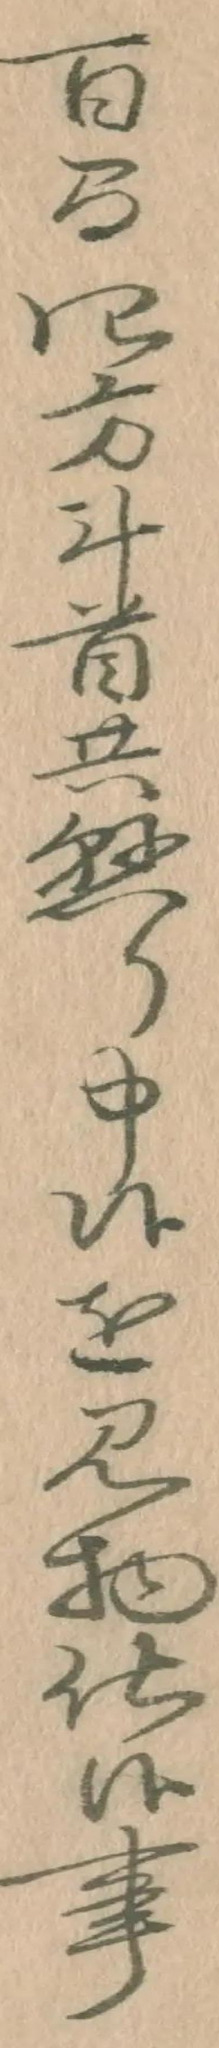百間四方斗首共懸り申候を見物候事

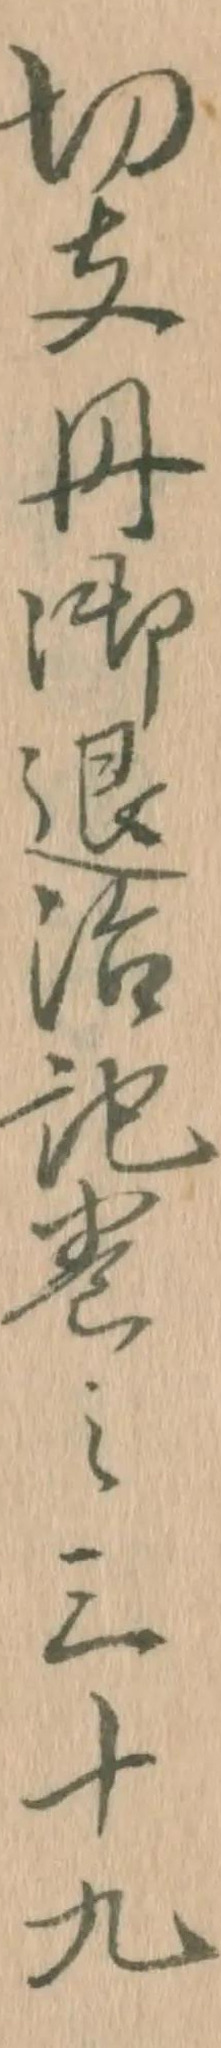切支丹御退治記巻之三十九
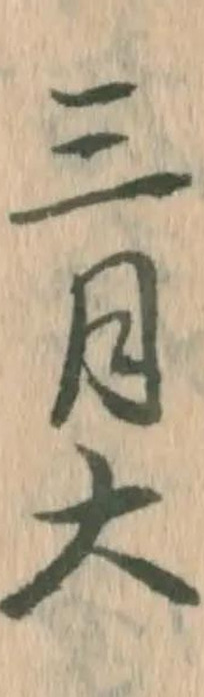三月大
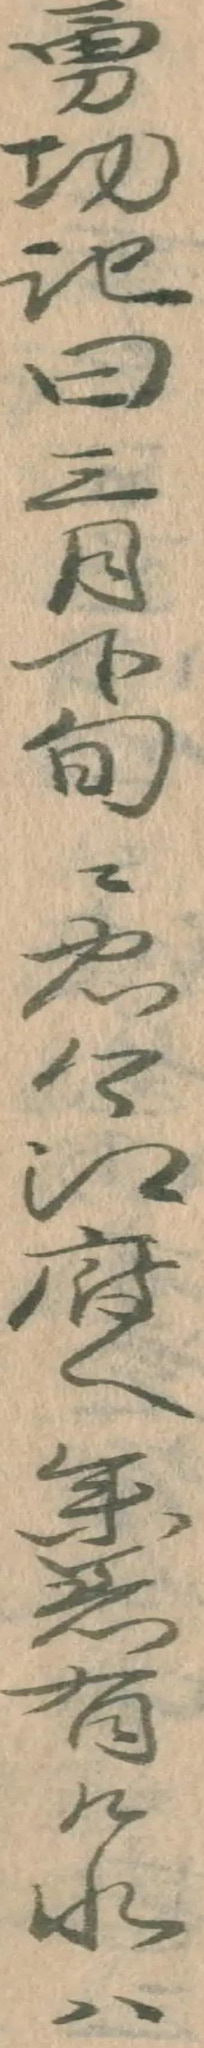勇功記曰三月下旬に忠郷江府へ参着有けれは
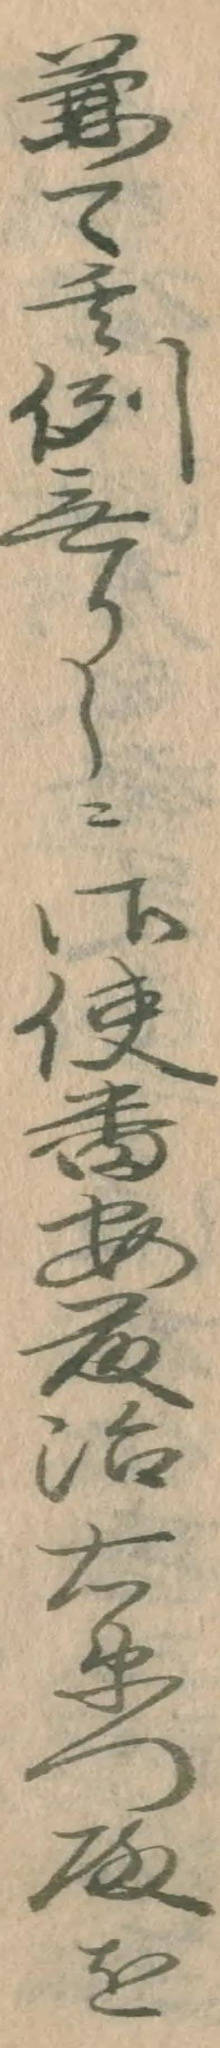兼て其例無りしに御使伴安藤治右衛門殿を
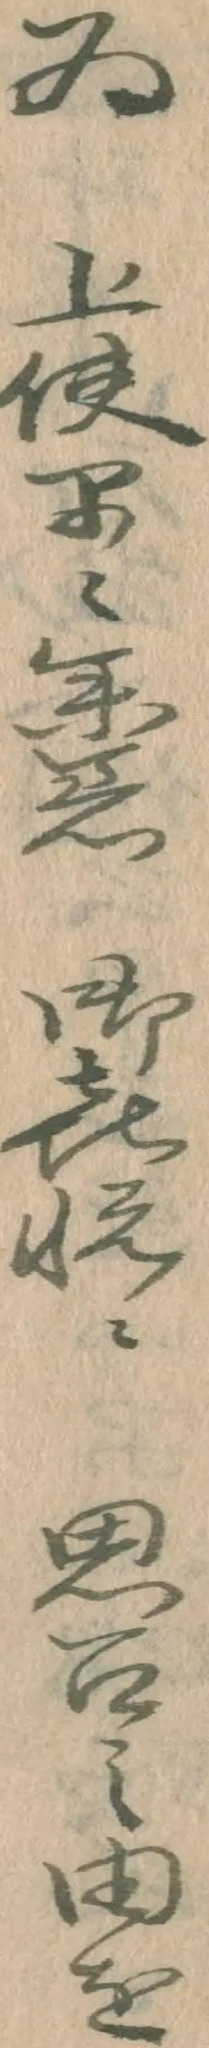ゐ上使早々参着御喜悦に思召之由を
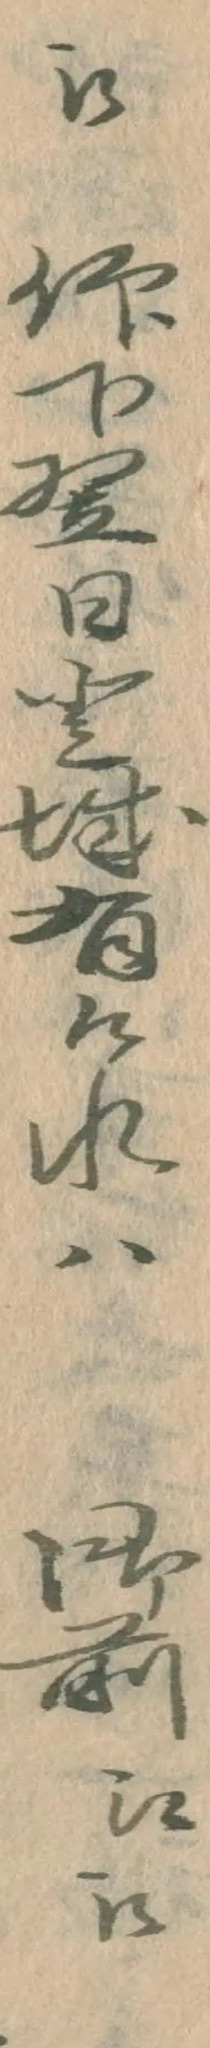被仰下翌日登城有けれは御前衛被
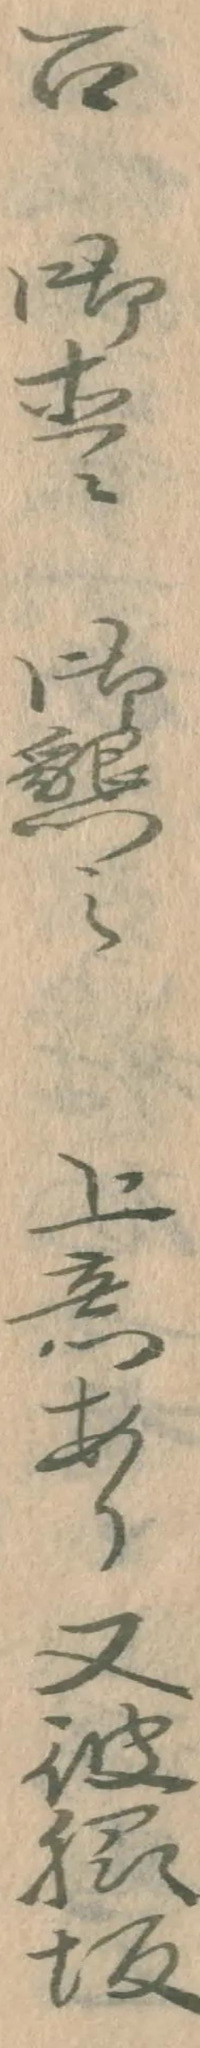召御直に御懇之上意あり又彼脇坂
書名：切支丹御退治記 49巻. [9]
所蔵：国立国会図書館 National Diet Library, JAPAN
